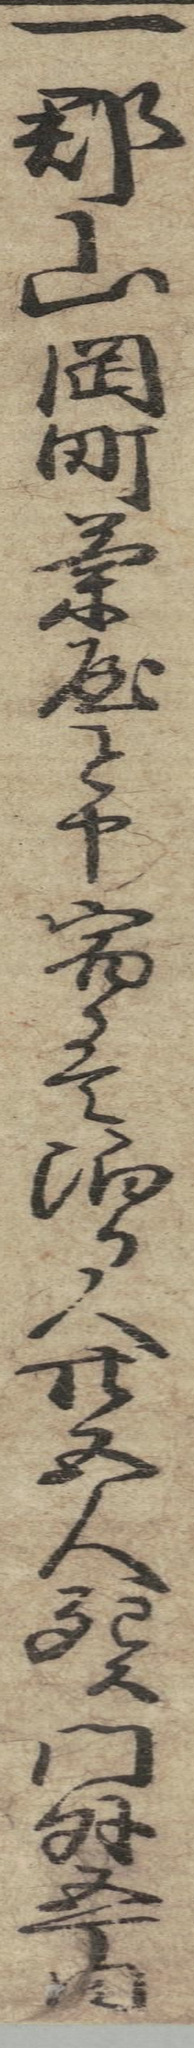一郡山岡町栄屋と申宿にて泊り人廿五人死す門外五丁目
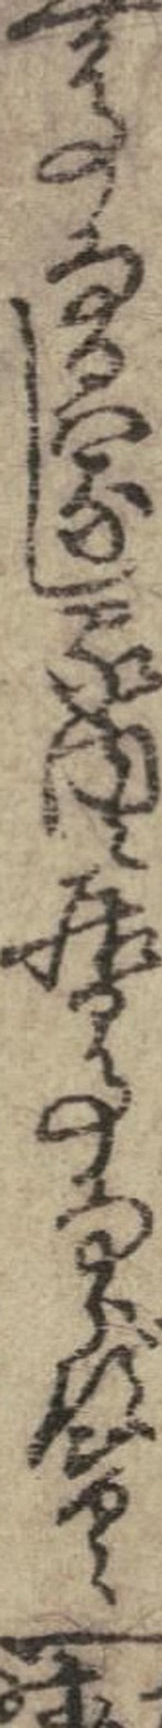無事なるはなし家内に居る事ならず皆〻
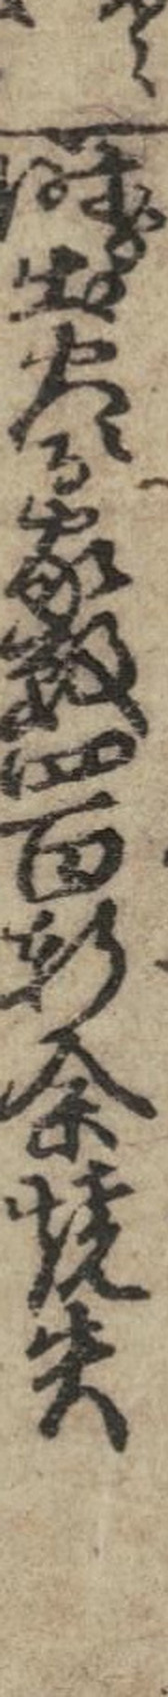時ゟ出火にて家数四百軒余焼失
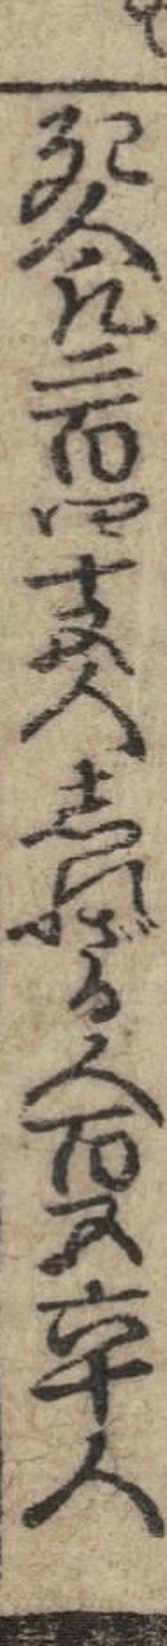死人凡二百四十五人志風？る人百五六十人
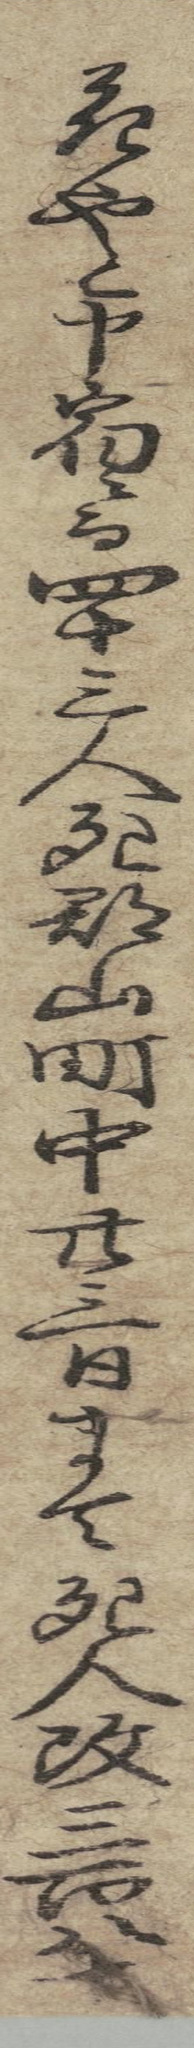花やと申宿にて四十三人死郡山町中廿三日まて死人三百八十
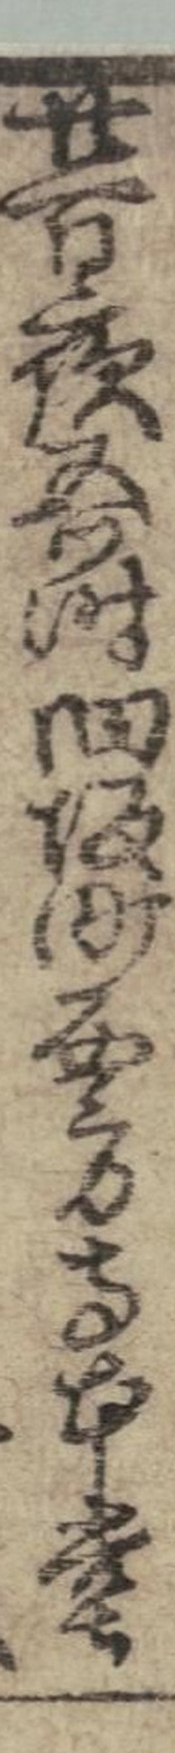廿一日夜五ツ時佃坂町西方寺本堂
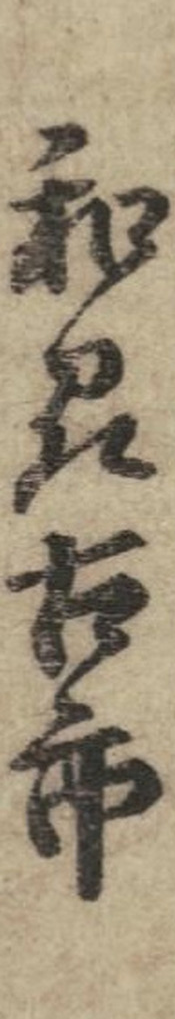和州古市
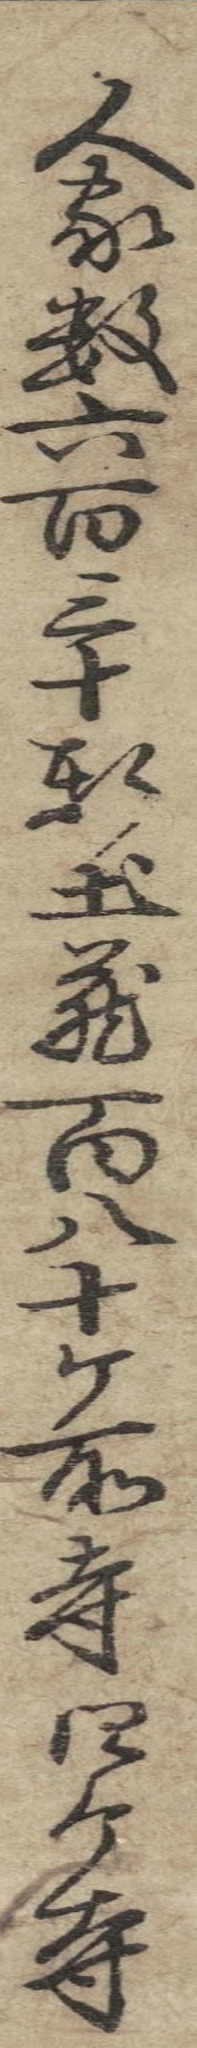人家数六百三十軒土蔵百八十ケ所寺四ケ寺
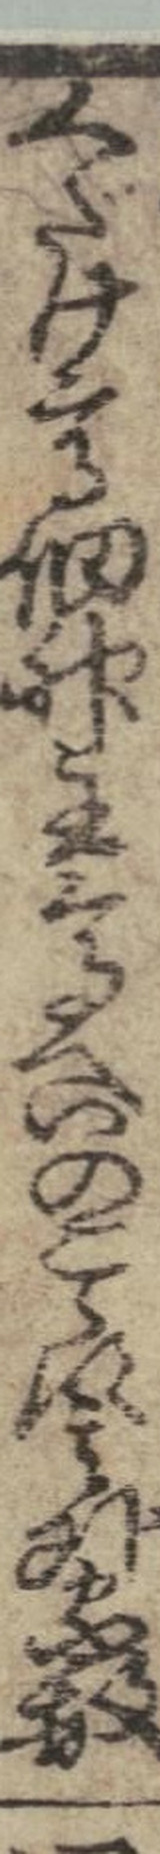くだけ高佃神主高へいのこらす其外家数
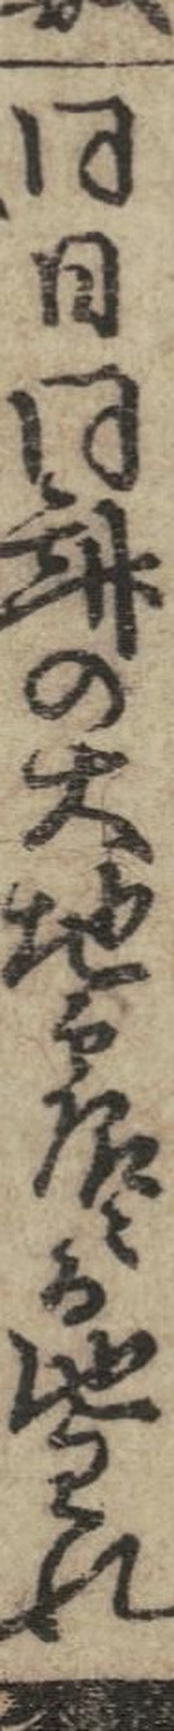同日同刻の大地震にて地われ
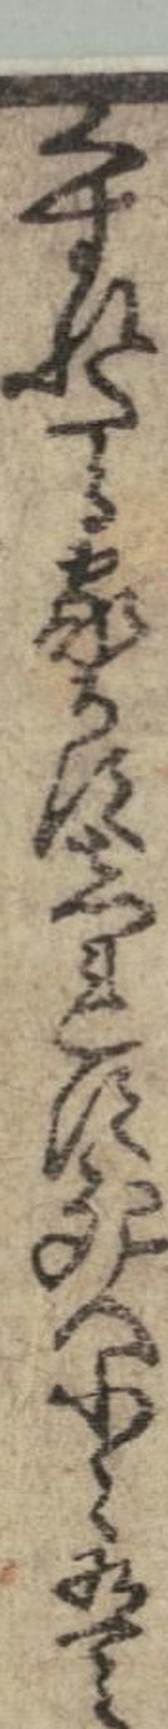くすれたる家かすしれす死人少〻有〻
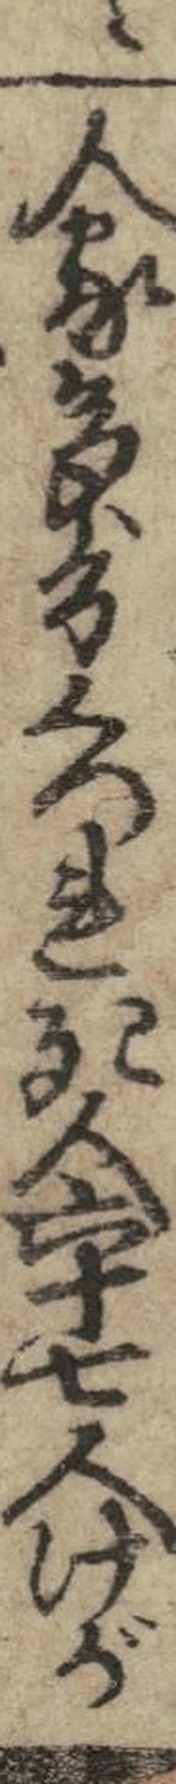人家多分くつれ死人六十七人けが
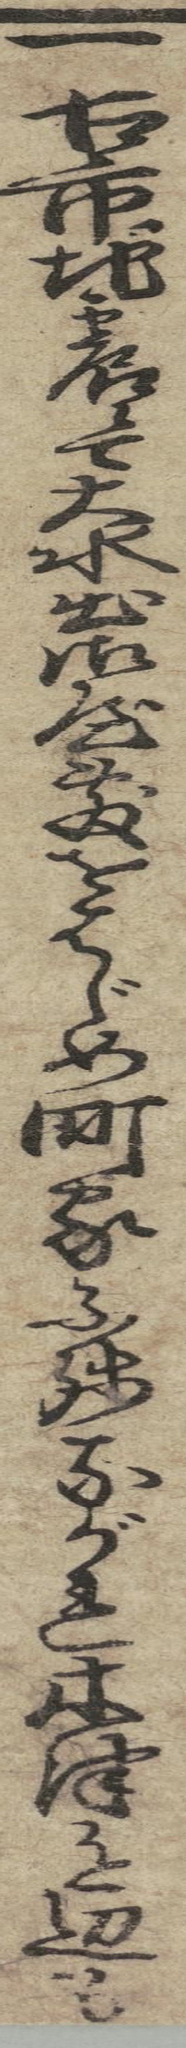一古市地震にて大水出御屋敷をはじめ町家不残ながれ木津近辺も
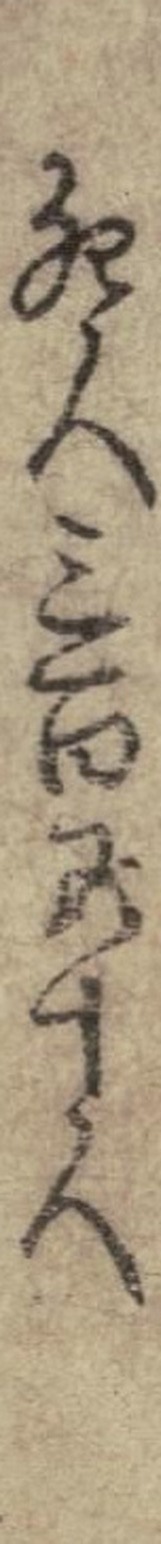死人三百五十人
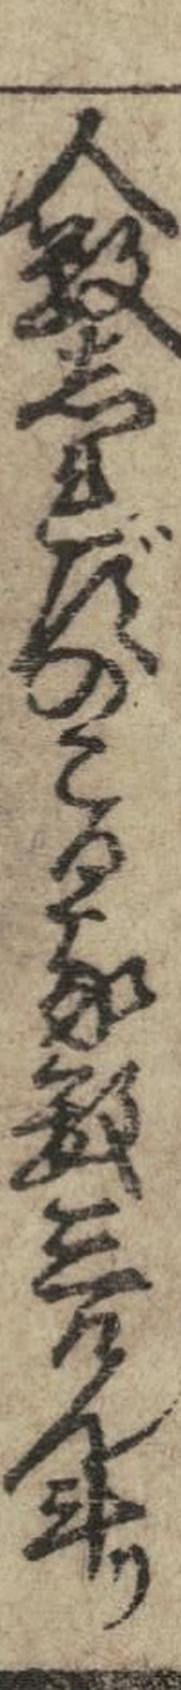人数しれずのこる家数三けん計り
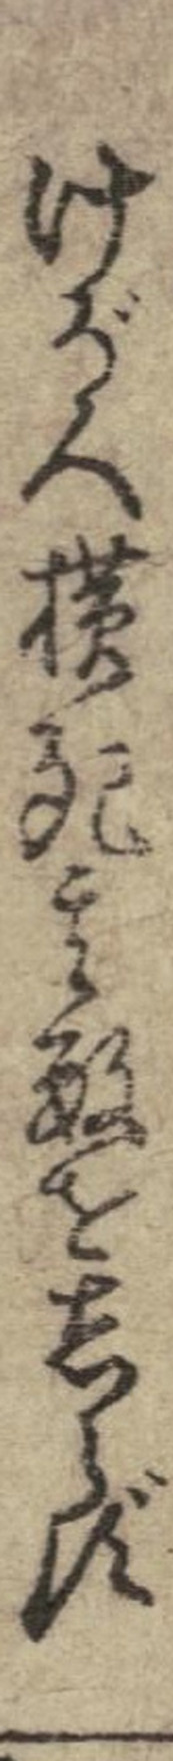けが人横死其数をしらず
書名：聞書　諸國大地震并ニ出火・早飛脚廻りにてくわしき所本しらべ　大地震・山城勢州大和三河江州越前　聞書　大地震並ニ出火の次第
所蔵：東京大学地震研究所図書室 Earthquake Research Institute Library, The University of Tokyo, JAPAN
